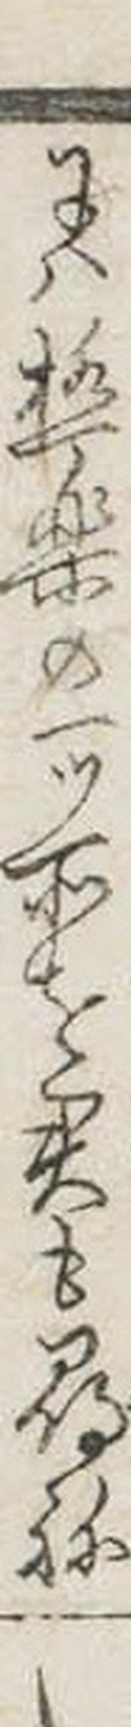には極楽の一ッ所を君も尋ね
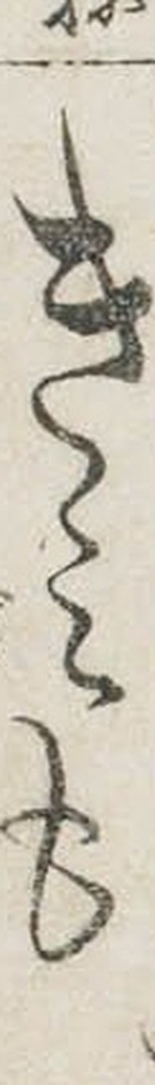きみも
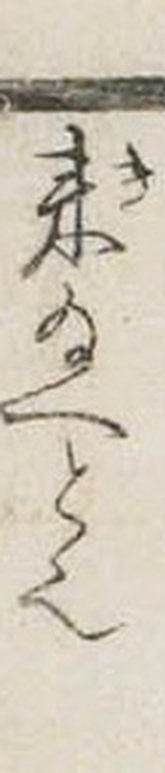来給へと也
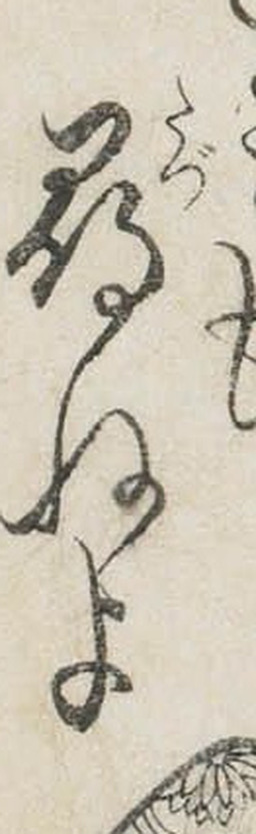尋ねよ

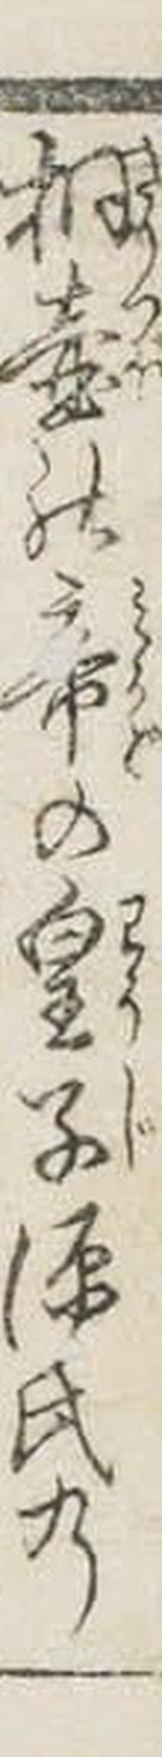桐壺の帝の皇子源氏の
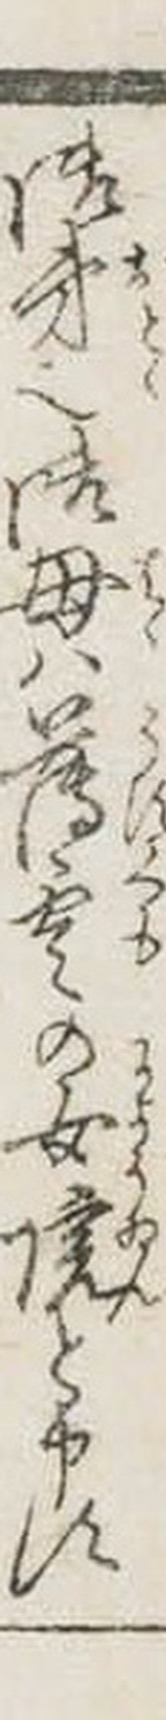御弟也御母は薄雲の女院と申す
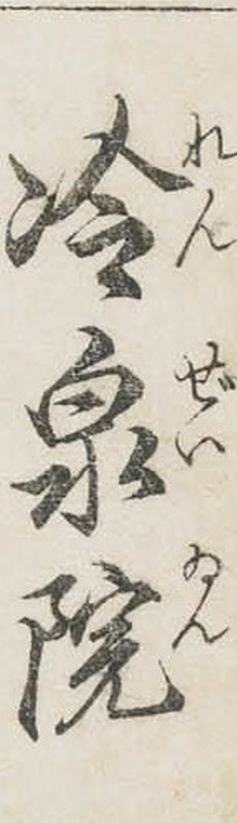冷泉院
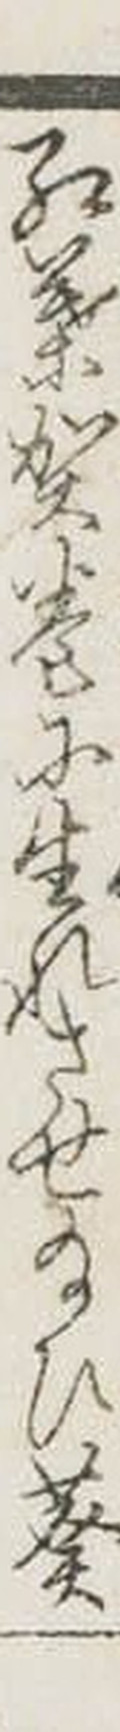紅葉賀巻に生れさせ給ひ葵
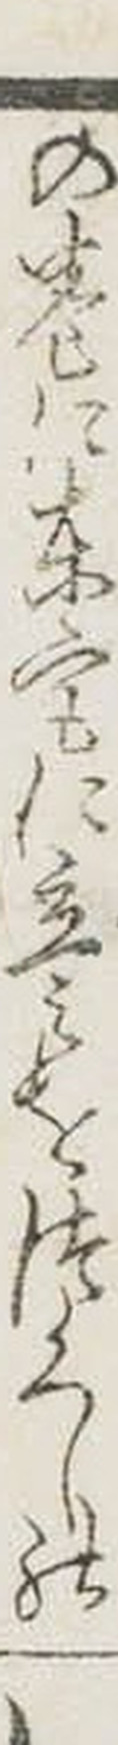の巻に東宮に立みをつくしの
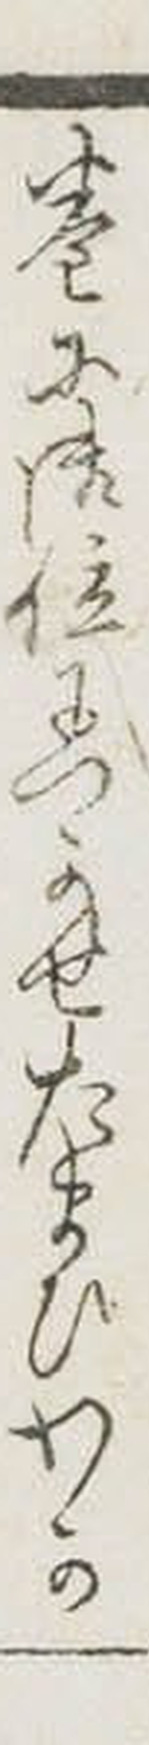巻に御位につかせたまひわか
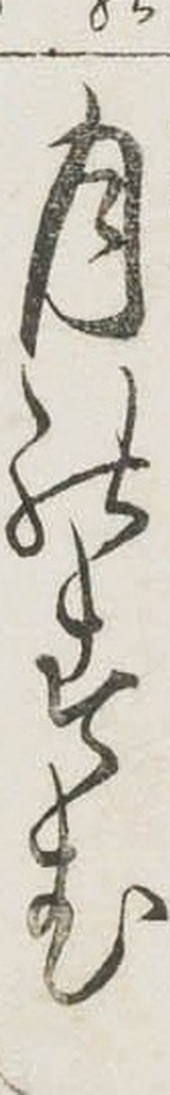月のすむ
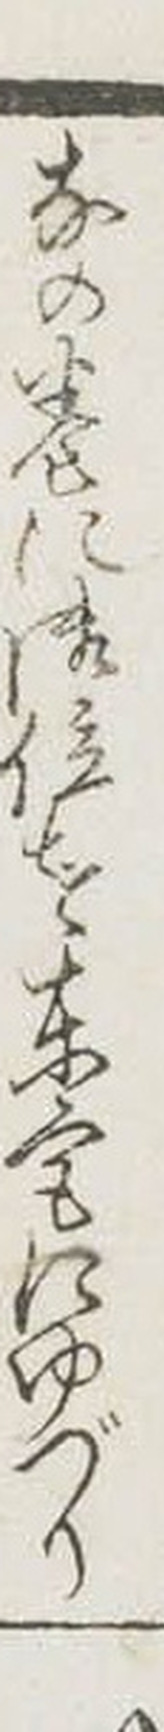なの巻に御位を東宮にゆづり
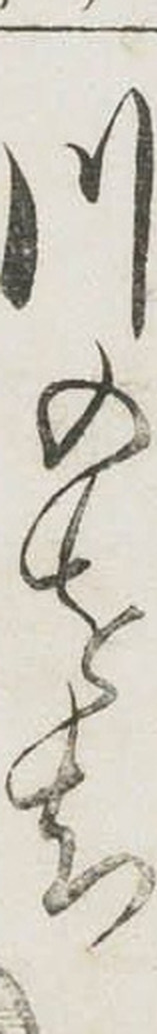川のをち
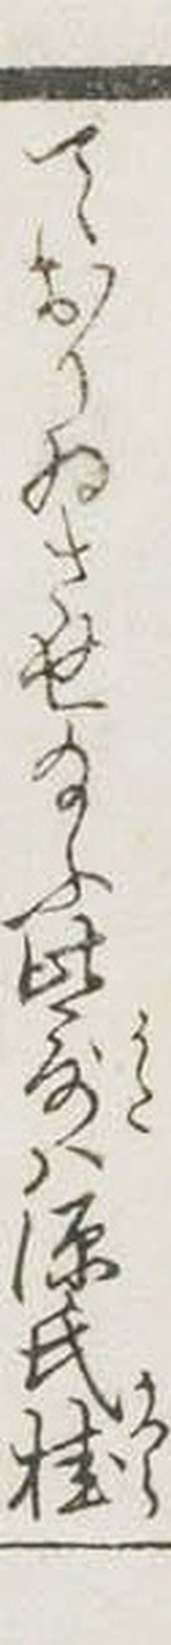ておりゐさせ給ふ此哥は源氏桂
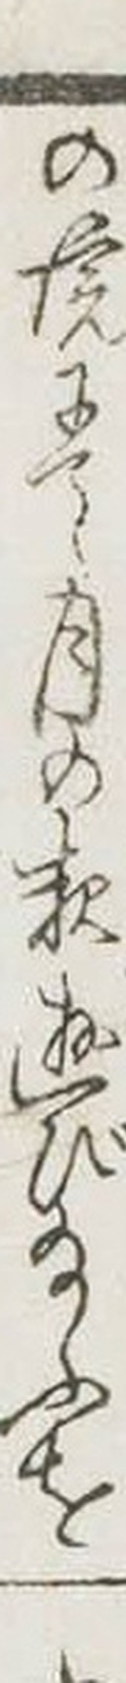の院にて月の夜遊び給ふを
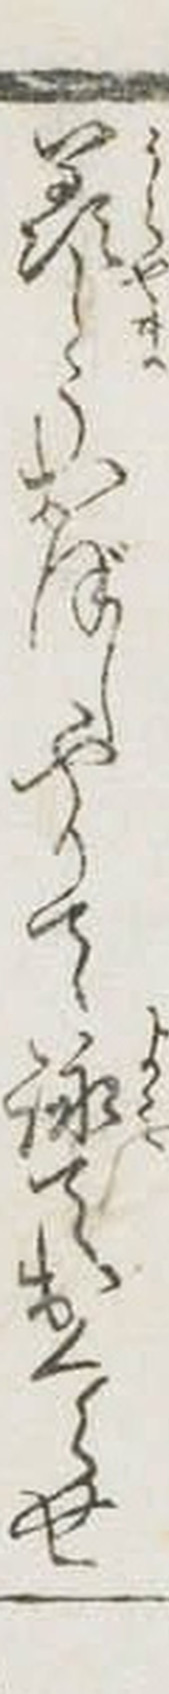羨しうおぼしやりて詠ておくらせ
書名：源氏百人一首
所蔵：東京学芸大学教育コンテンツアーカイブ
